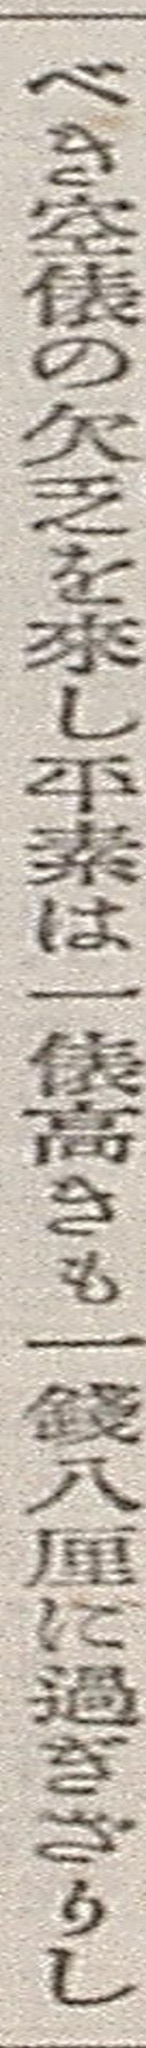べき空俵の欠乏を来し平素は一俵高きも一銭八厘に過ぎざりし
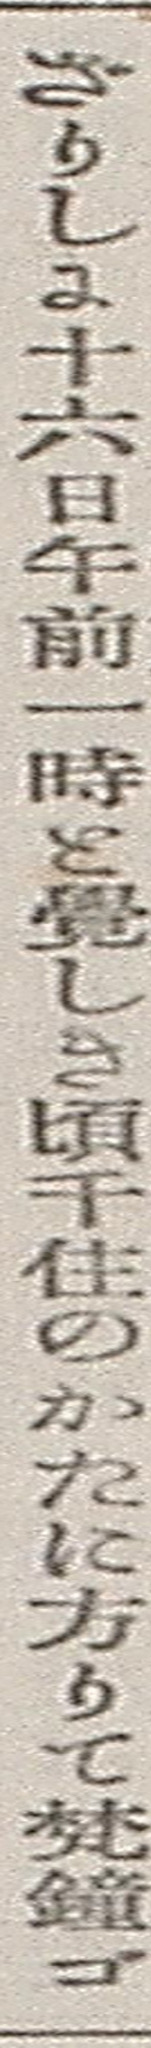ざりしに十六日午前一時と覚しき頃千住のかたに方れて梵鐘ゴ
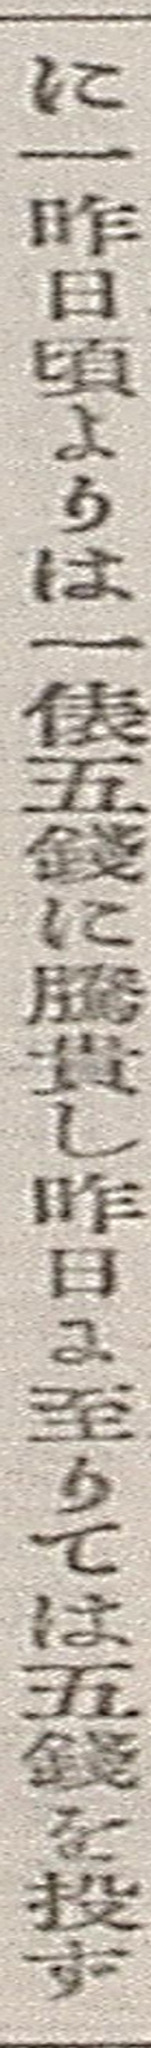に一昨日頃よりは一俵五銭に騰貴し昨日に至りては五銭を投ず
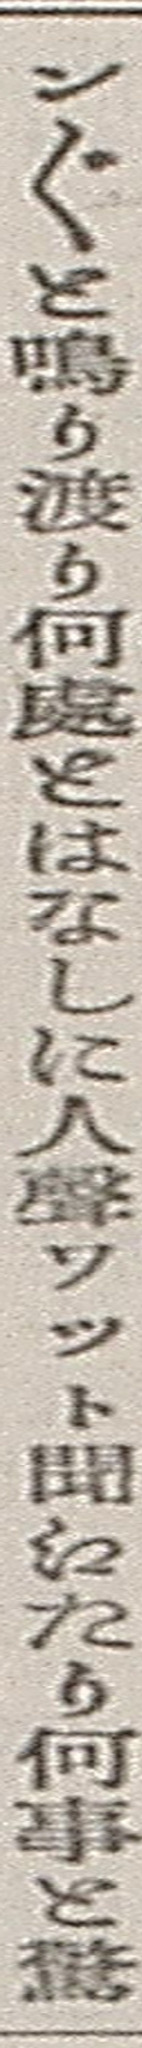ン〴〵と鳴り渡り何処とはなしに人声ソツト聞えたり何事と驚
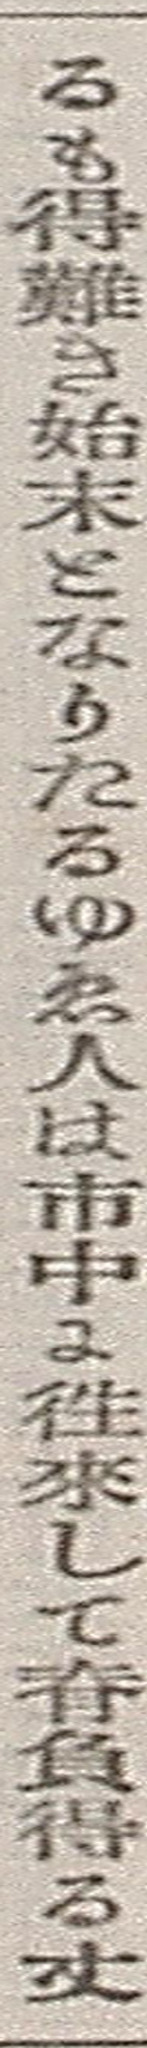るも得難き始末となりたるゆゑ人は市中に往来して背負得る丈
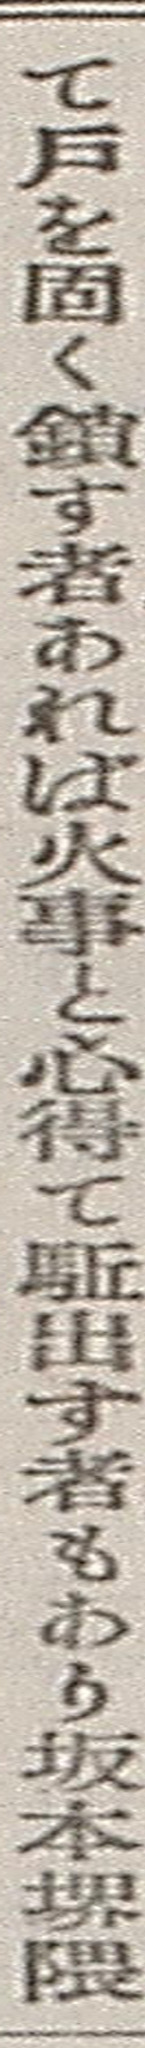て戸を固く鎖す者あれば火事と心得て駈出す者もあり坂本堺隈
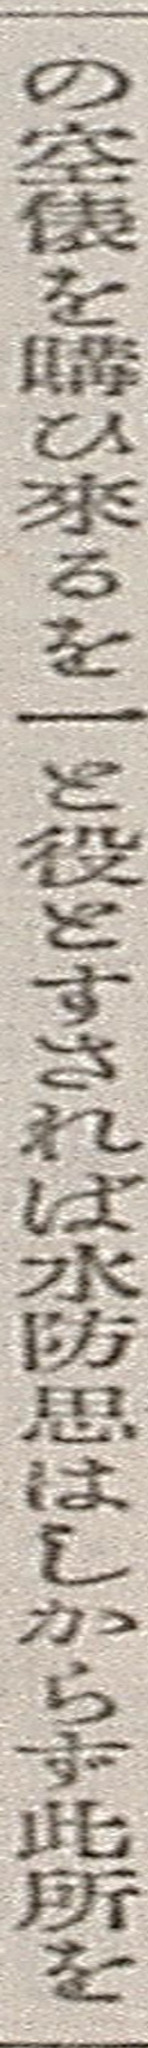の空俵を購ひ来るを一と役とすされば水防思はしからず此所を
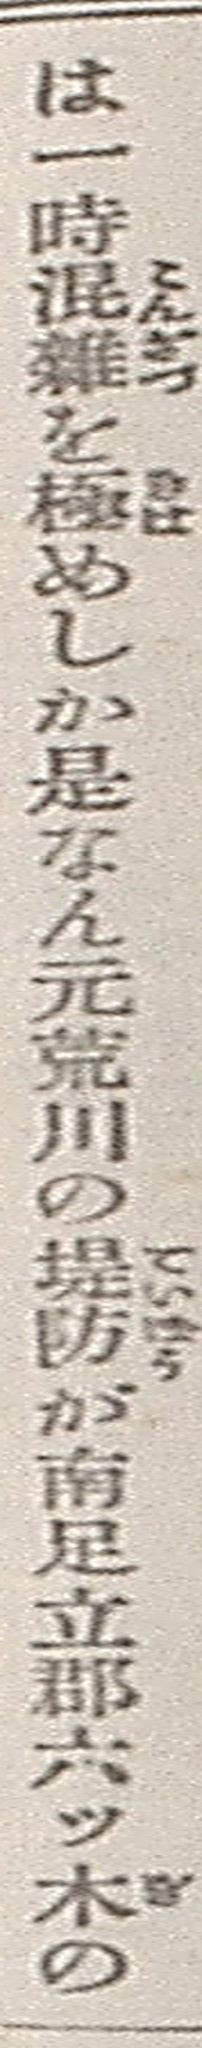は一時混雑を極めしか是なん元荒川の堤防が南足立郡六ツ木の
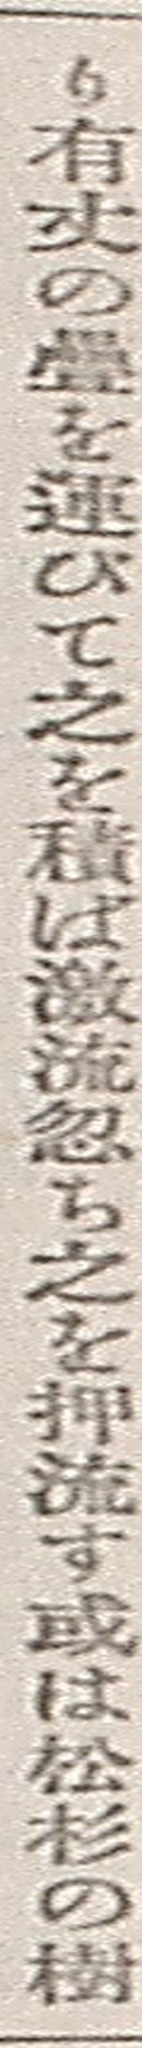り有丈の畳を運びて之を積ば激流忽ち之を押流す或は松杉の樹
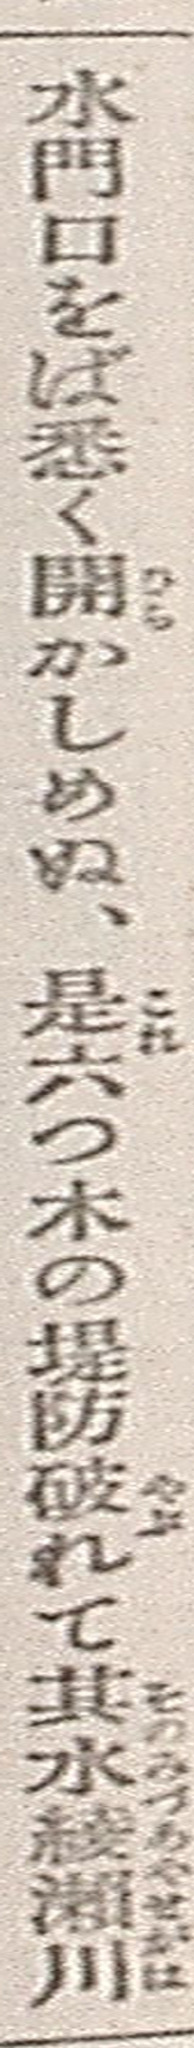水門口をば悉く開かしめぬ、是六つ木の堤防破れて其水綾瀬川
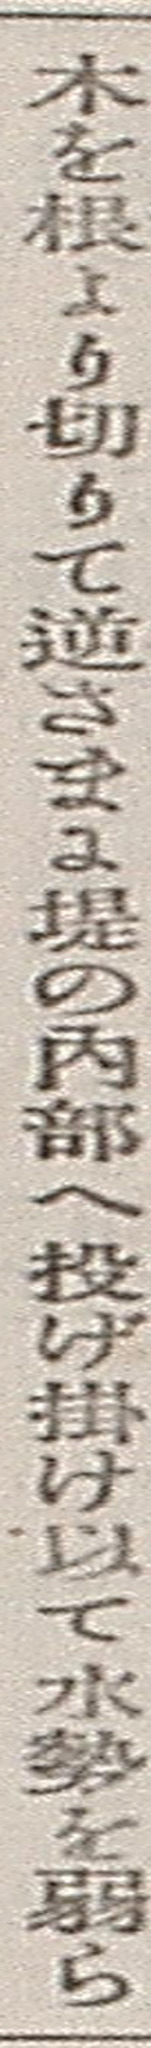木を根より切りて逆さまに堤の内部へ投げ掛け以て水勢を弱ら
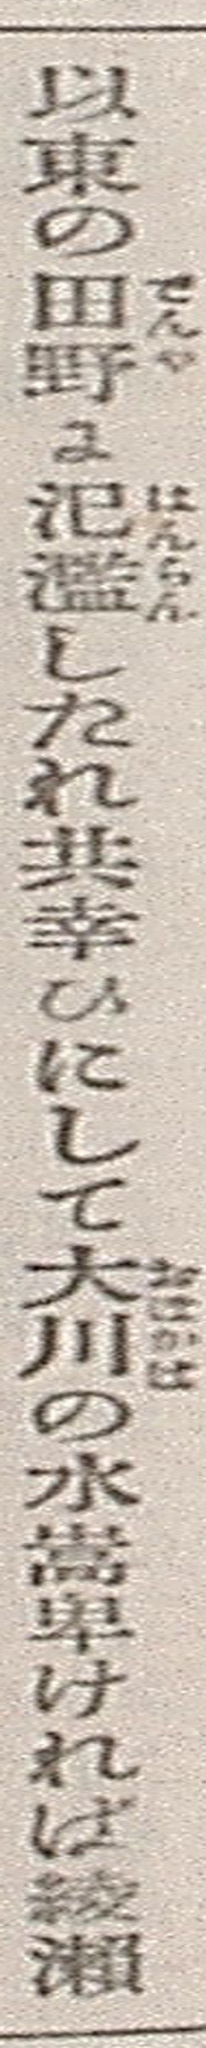以東の田野に氾濫したれ共幸ひにして大川の水嵩卑ければ綾瀬
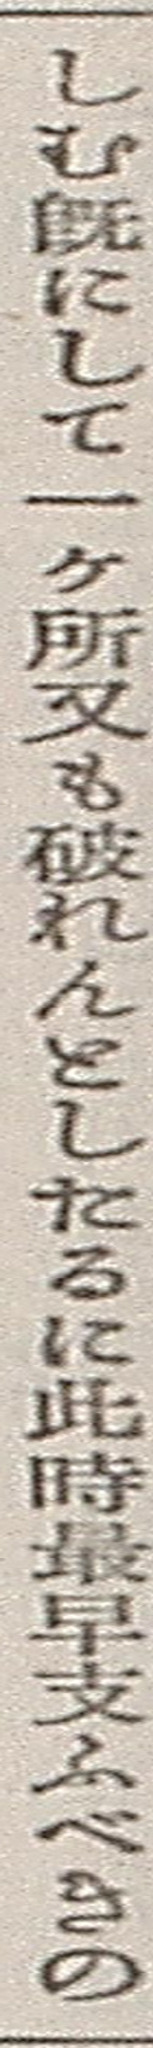しむ既にして一ヶ所又も破れんとしたるに此時最早支ふべきの
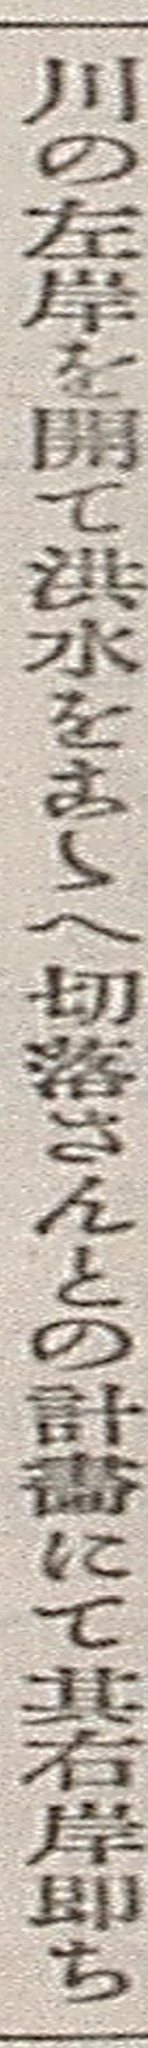川の左岸を開て洪水をこゝへ切落さんとの計画にて其右岸即ち
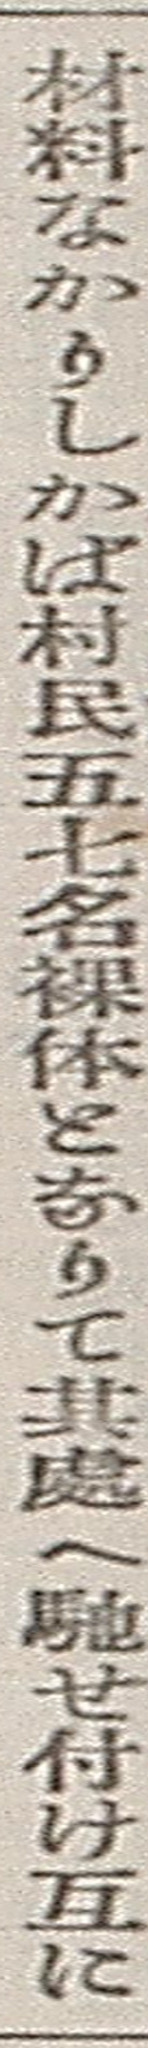材料なかりしかば村民五七名裸体となりて其処へ馳せ付け互に
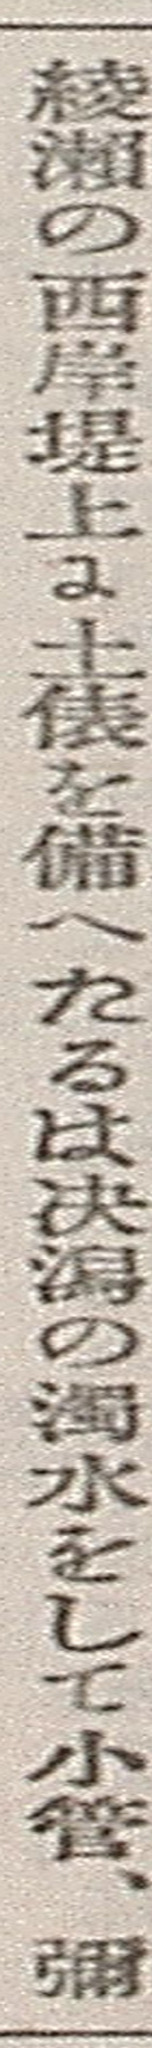綾瀬の西岸堤上に土俵を備へたるは決潟の濁水をして小菅、弥
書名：風俗畫報臨時増刊第百二十四號　洪水地震被害録（上）
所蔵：東京大学地震研究所図書室 Earthquake Research Institute Library, The University of Tokyo, JAPAN
